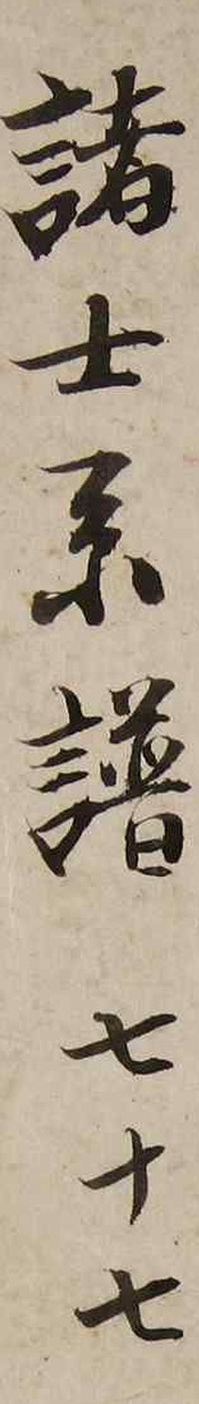諸士系譜七十七

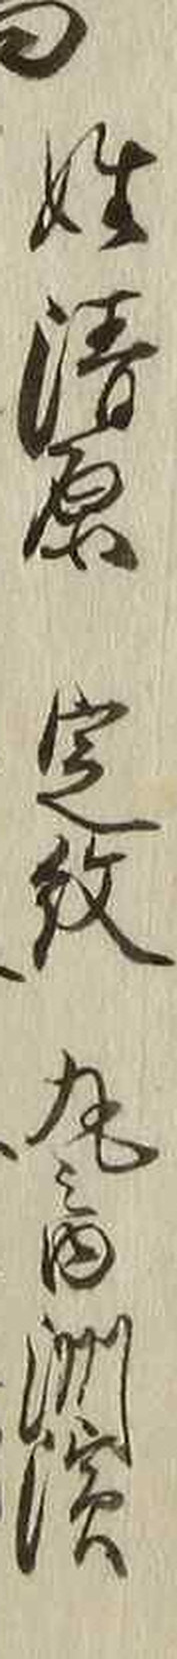姓清原定紋丸之内州濱
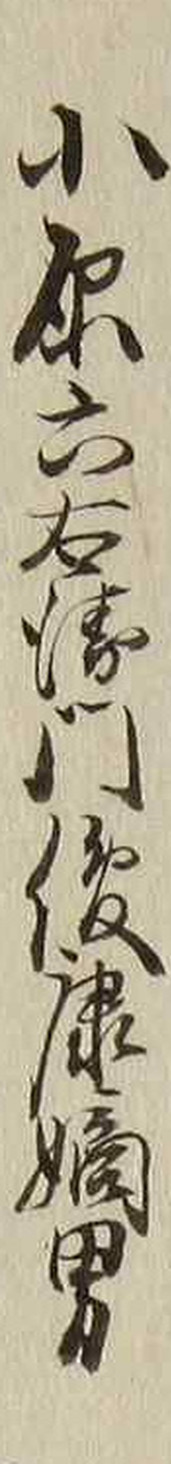小原六右衛門俊康嫡男
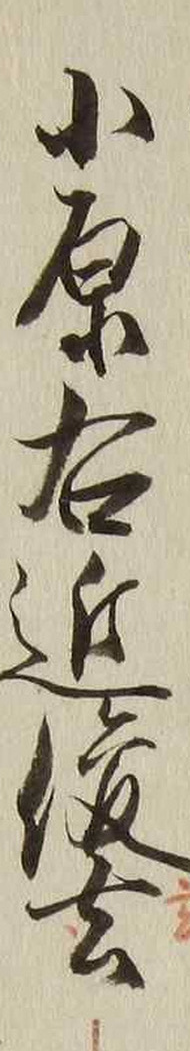小原右近俊玄
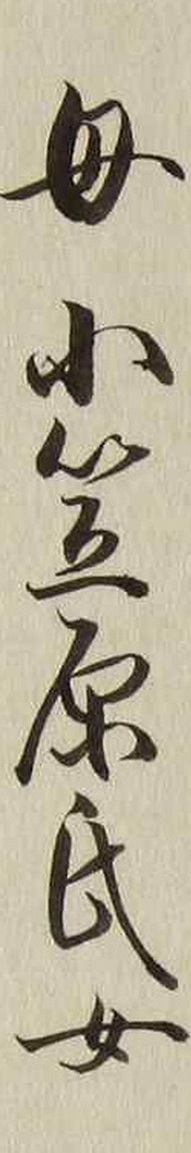母小笠原氏女
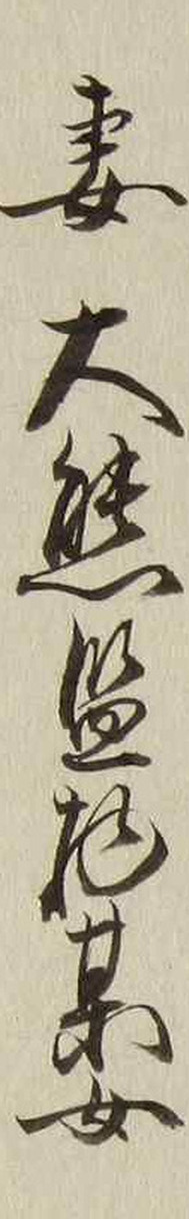妻大熊監物某女
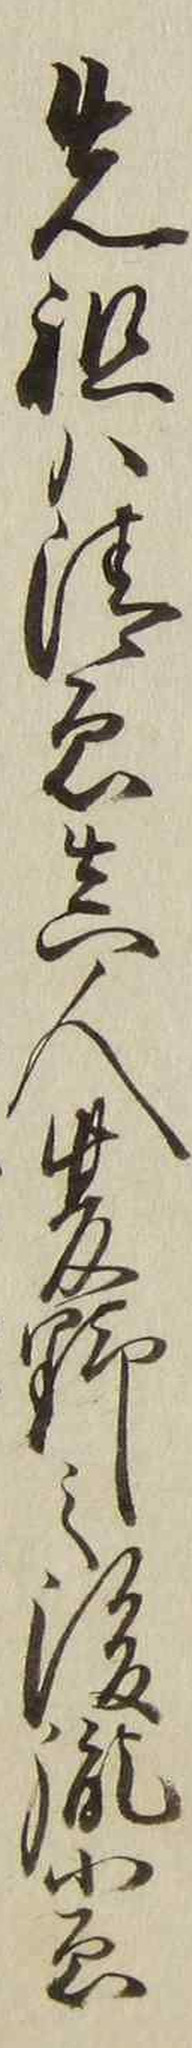先祖は清原真人夏野之後胤小原

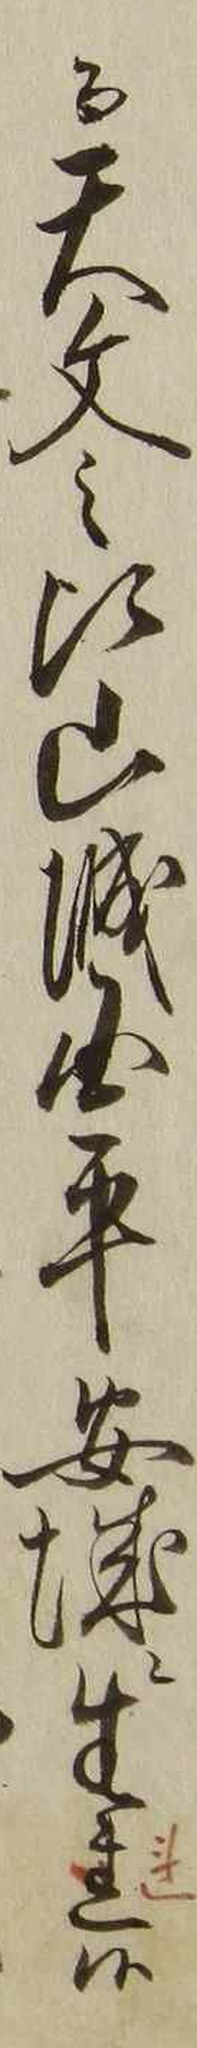而天文之頃山城国平安城に生れ候
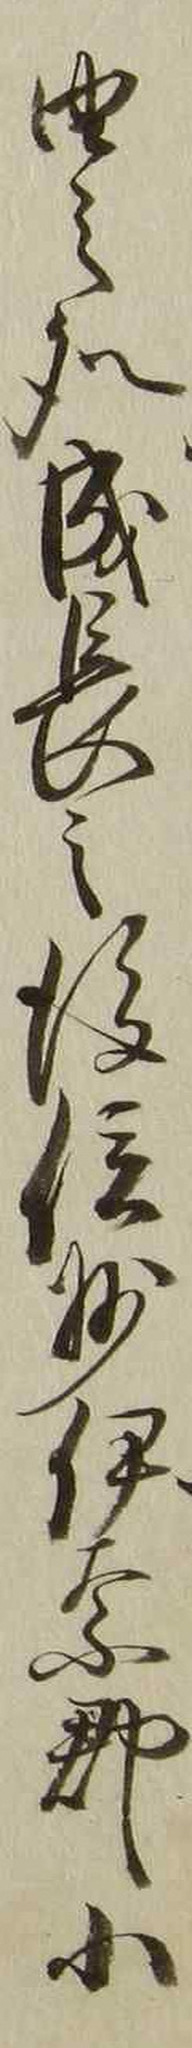由之処成長之後信州伊奈郡小
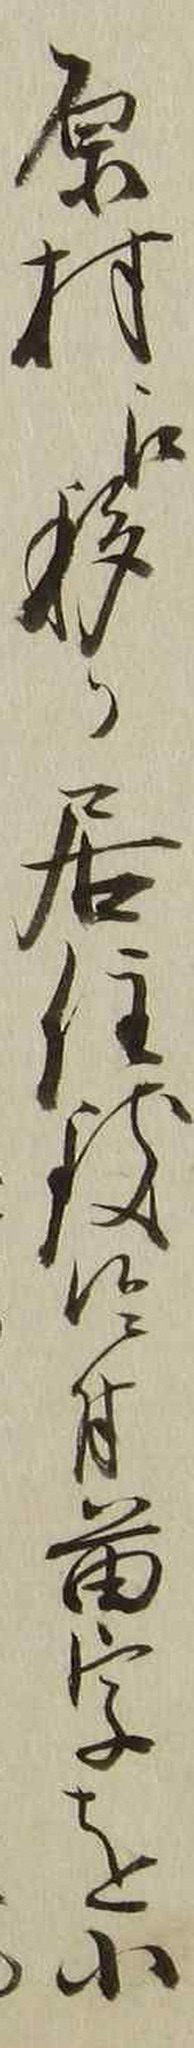原村江移り居住致候に付苗字を小
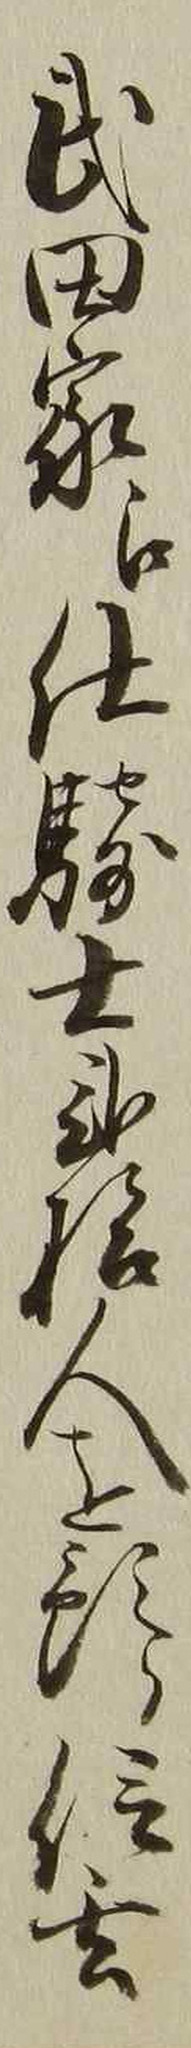武田家江仕騎士弐拾人を預り信玄
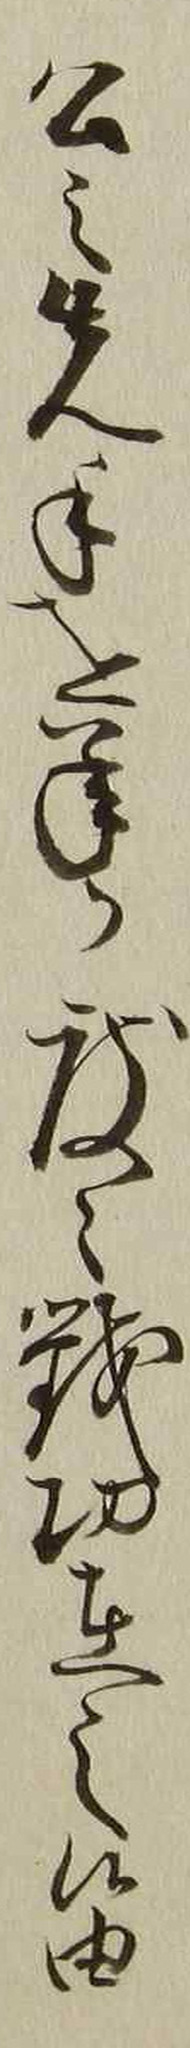公之先手を承り度々戦功在之候由
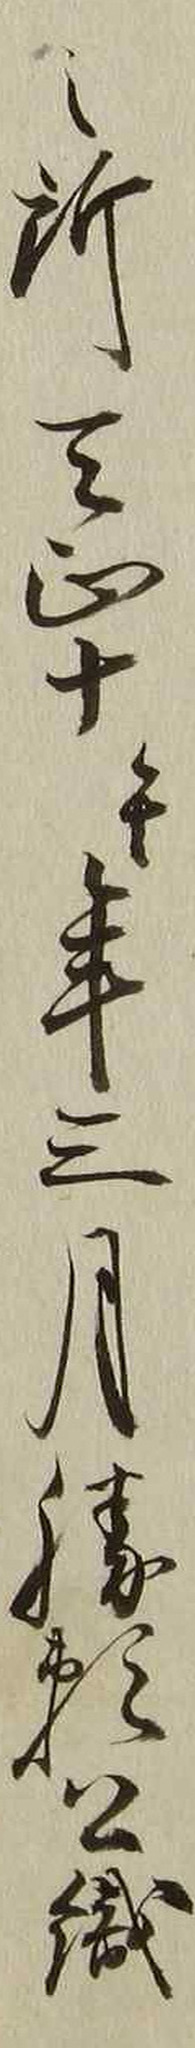之所天正十午年三月勝類公織
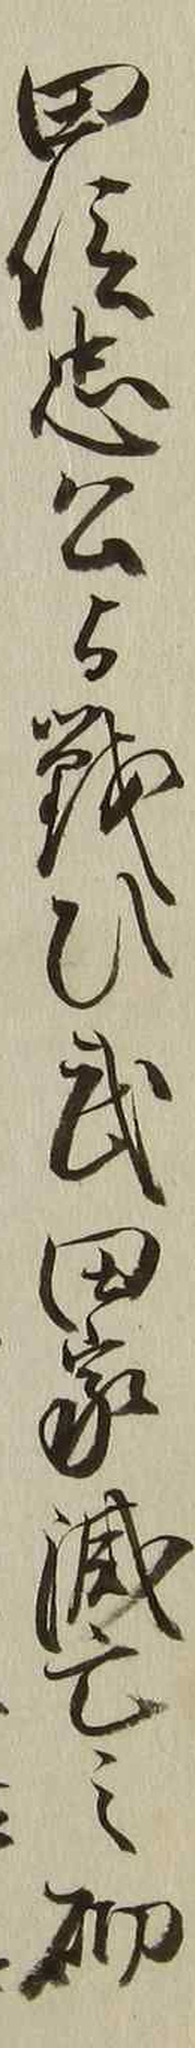田信忠公と戦ひ武田家減亡之砌
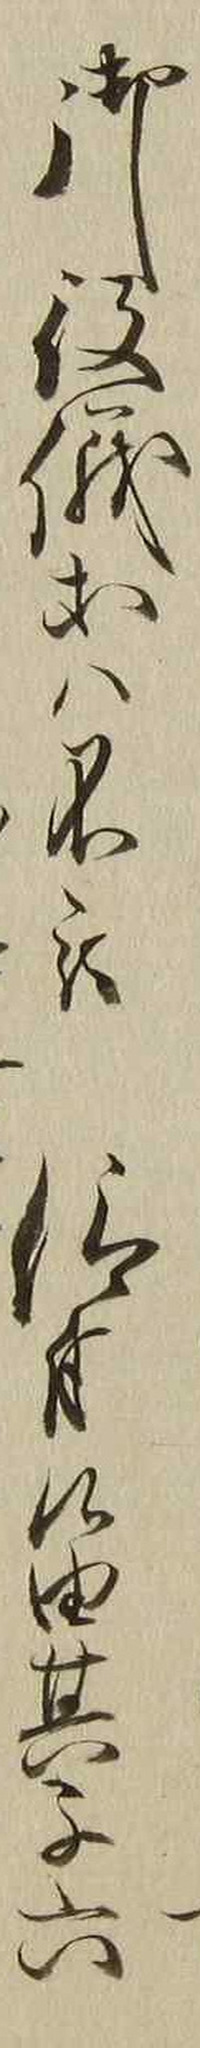御役儀等は不被仰付候由其子六
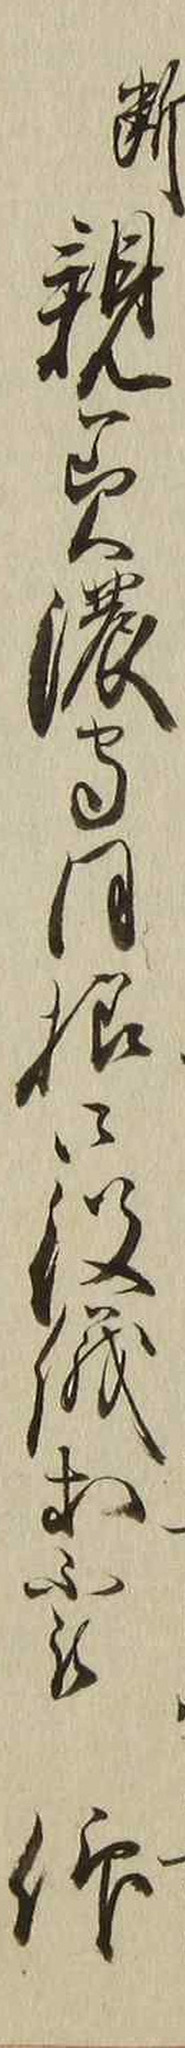断親美濃守同様御役儀等不被仰
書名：諸士系譜　巻之77　を之部11
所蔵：会津若松市立会津図書館
